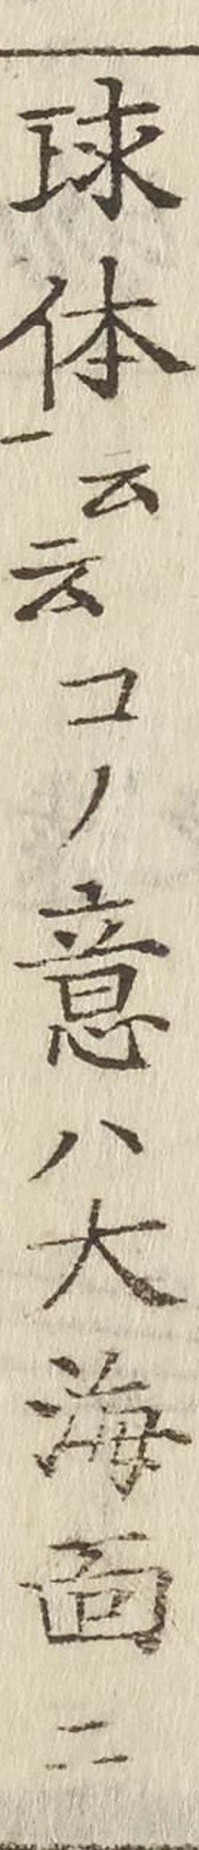球体云云コノ意ハ大海面ニ
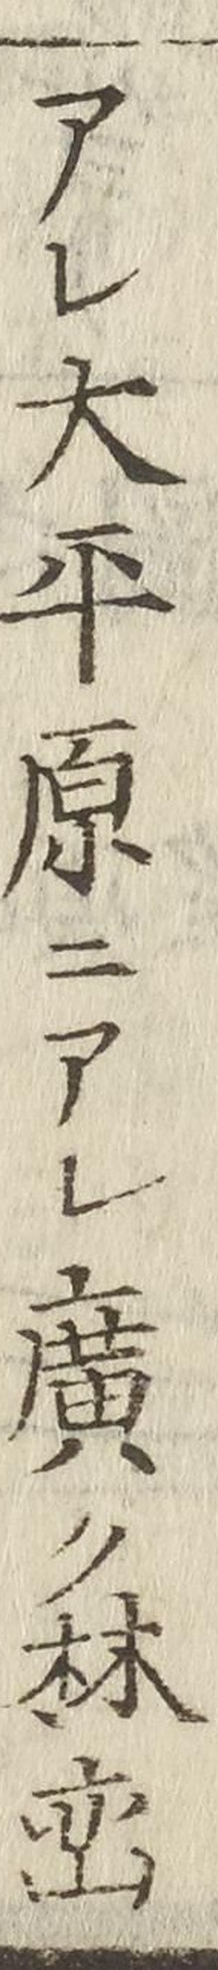アレ大平原ニアレ広ク林峦
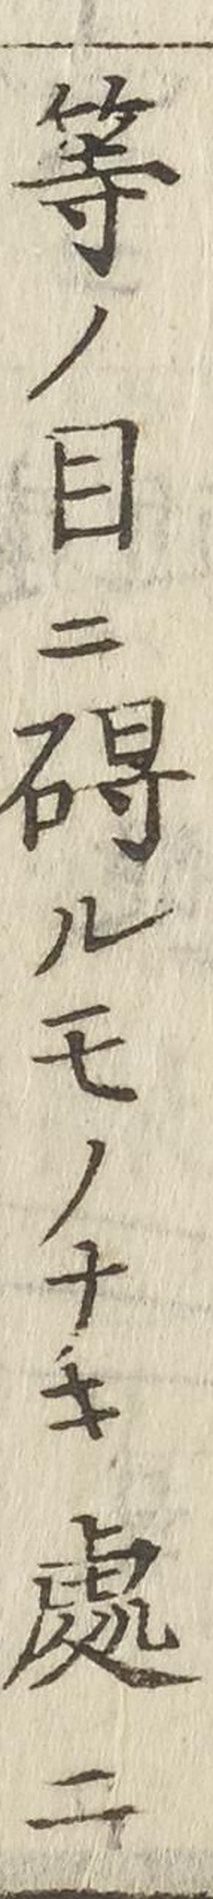等ノ目ニ碍ルモノナキ処ニ
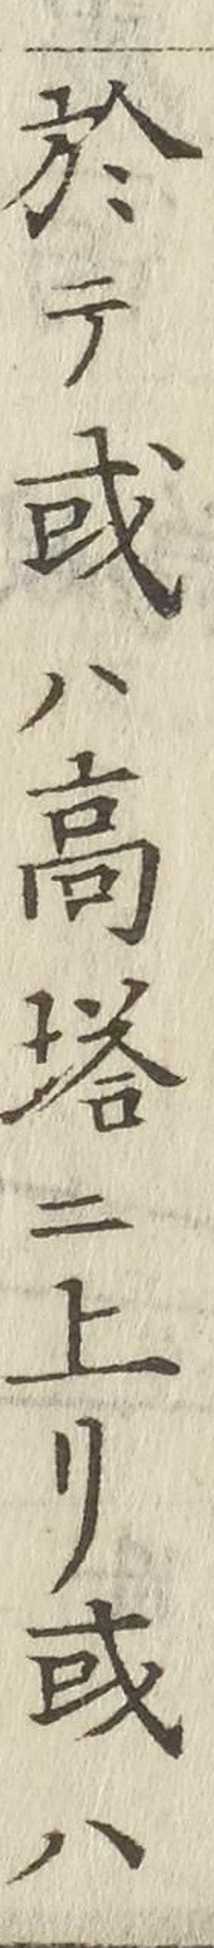於テ或ハ高塔ニ上リ或ハ
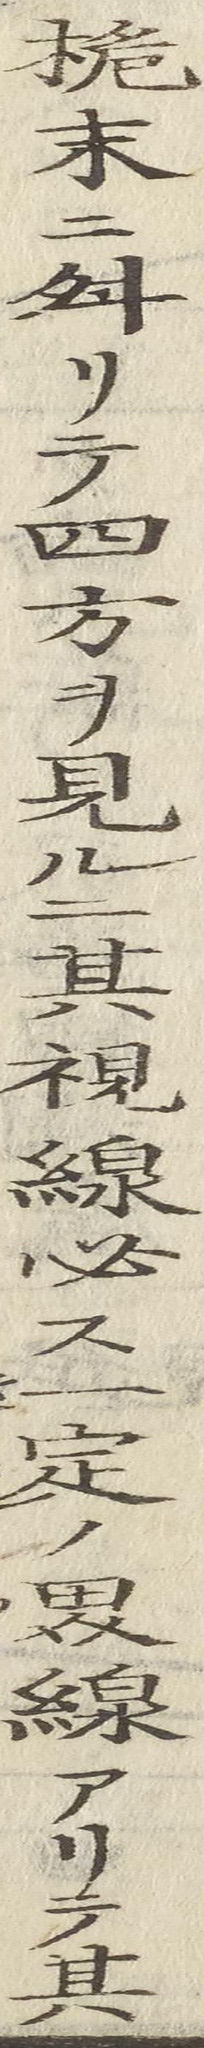桅末ニ舛リテ四方ヲ見ルニ其視線必ス一定ノ界線アリテ其
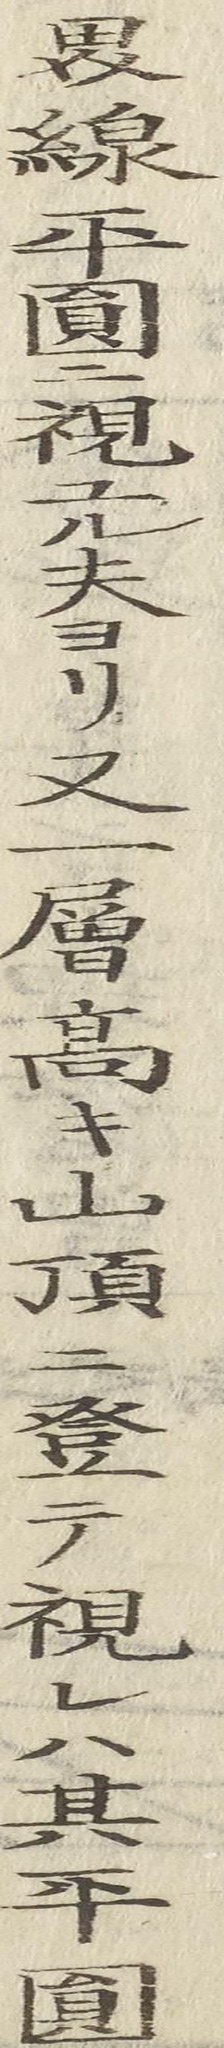界線平円ニ視ユル夫ヨリ又一層高キ山頂ニ登テ視レハ其平円
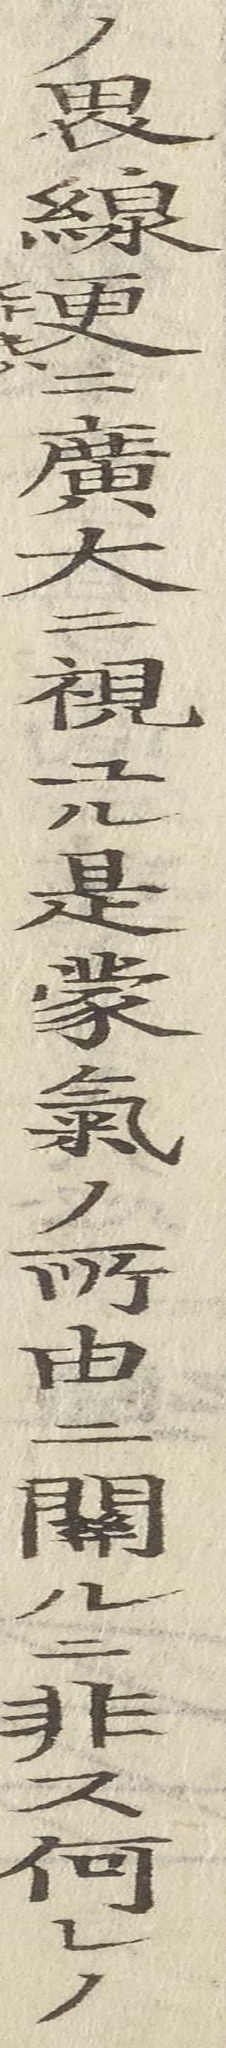ノ界線更ニ広大ニ視ユル是蒙気ノ所由ニ関ルニ非ス何レノ
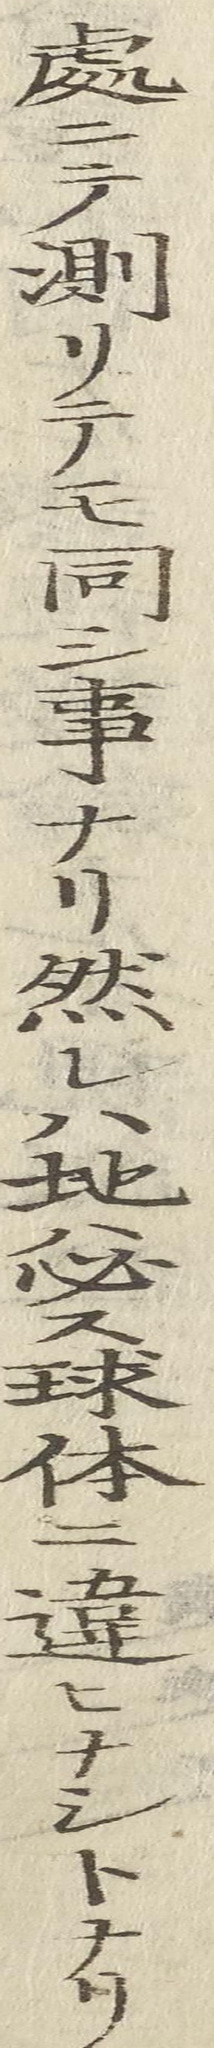処ニテ測リテモ同シ事ナリ然レハ地ハ必ス球体ニ違ヒナシトナリ

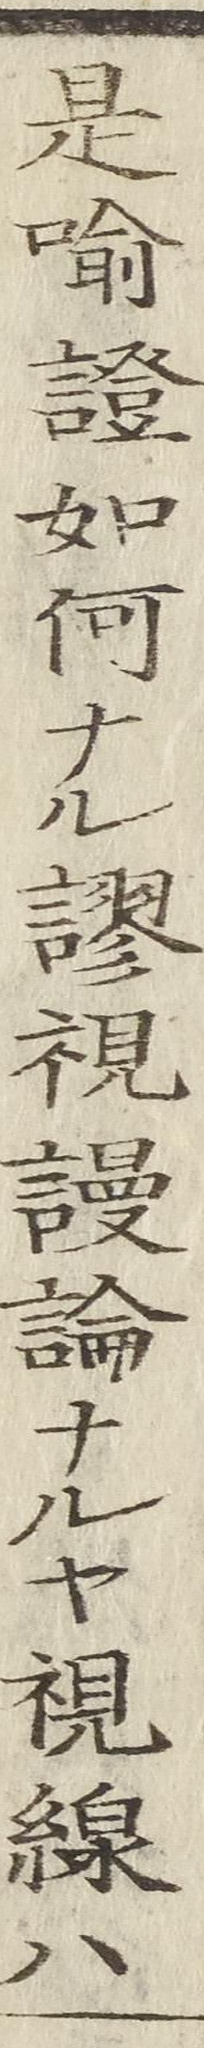是喩証如何ナル謬視謾論ナルヤ視線ハ
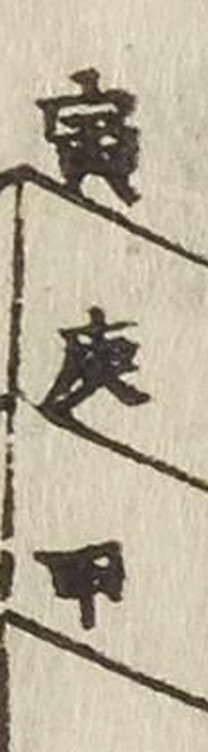寅庚甲
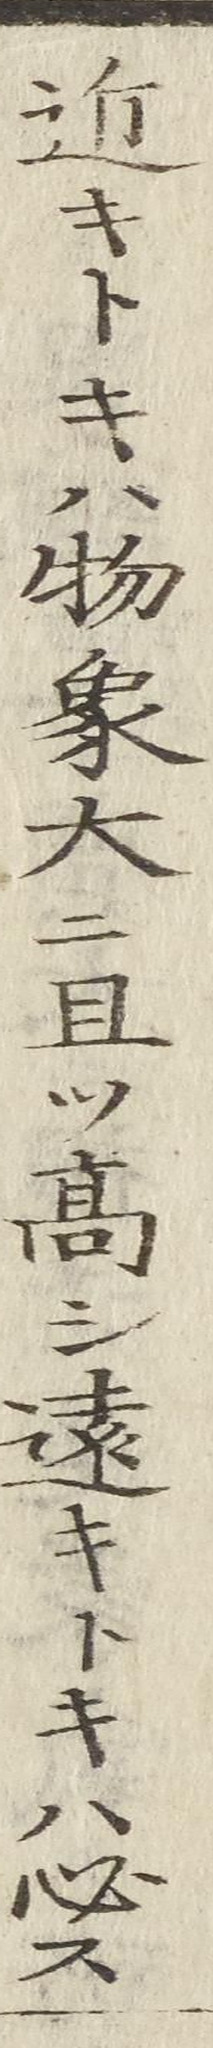近キトキハ物象大ニ且ツ高シ遠キトキハ必ス
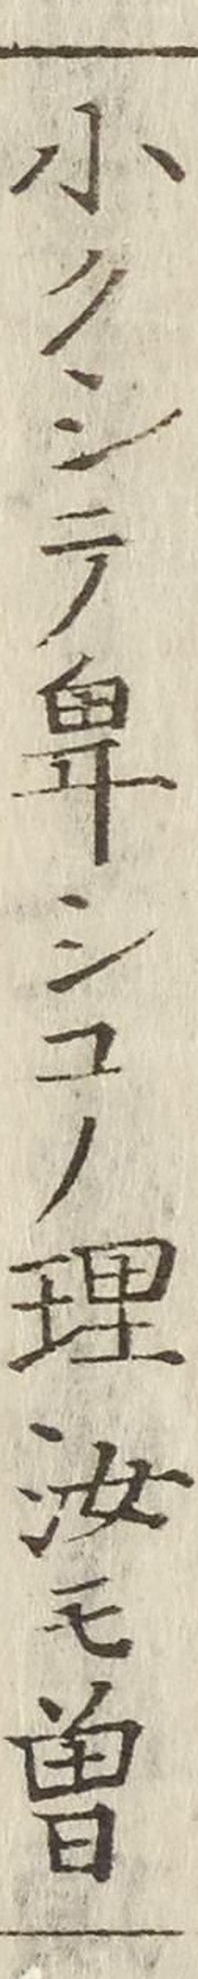小クシテ卑シコノ理汝モ嘗
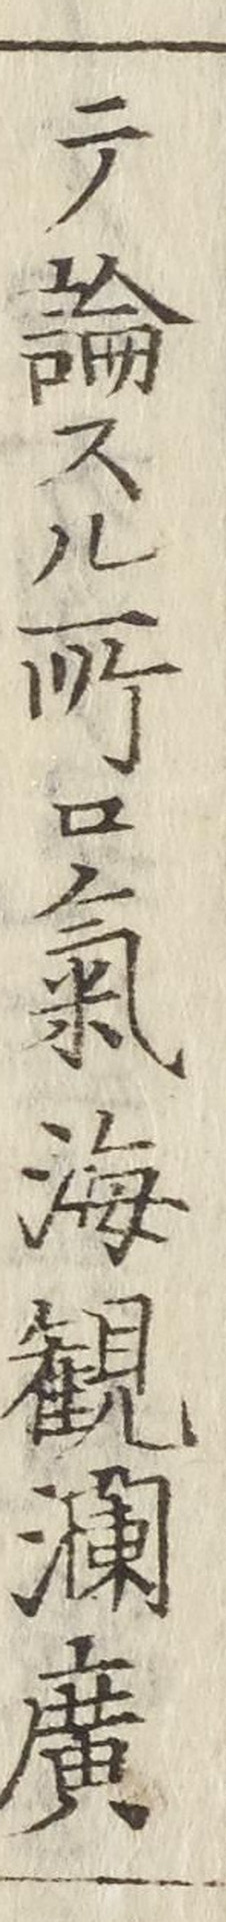テ論スル所ロ気海観瀾広
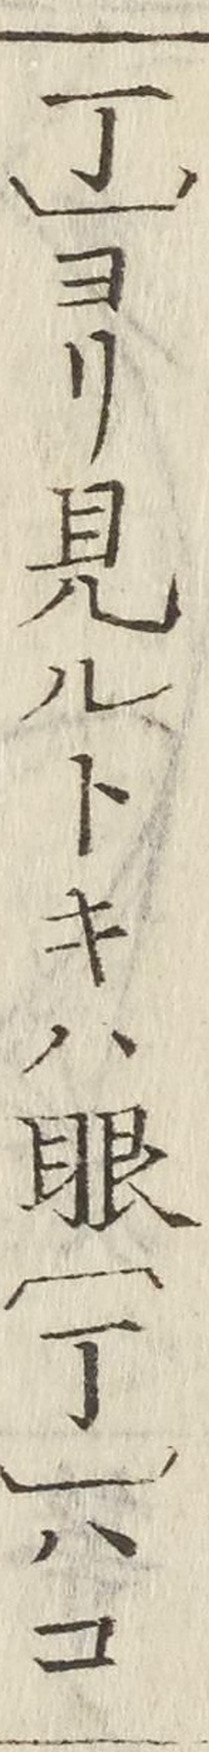丁）ヨリ見ルトキハ眼ハコ
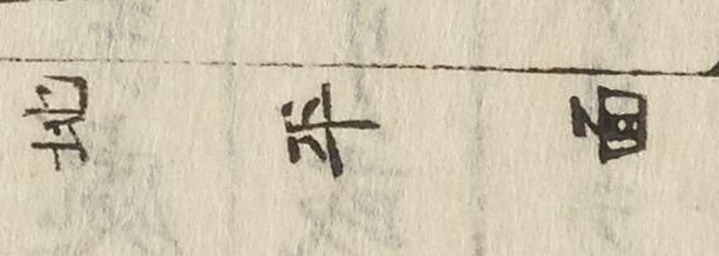地平面
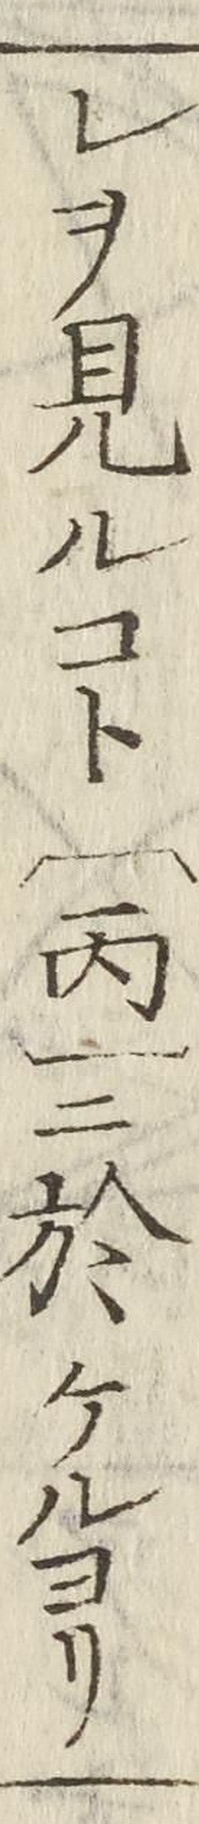レヲ見ルコトニ於ケルヨリ
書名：護法新論　二編　下
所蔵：東京大学地震研究所図書室 Earthquake Research Institute Library, The University of Tokyo, JAPAN
